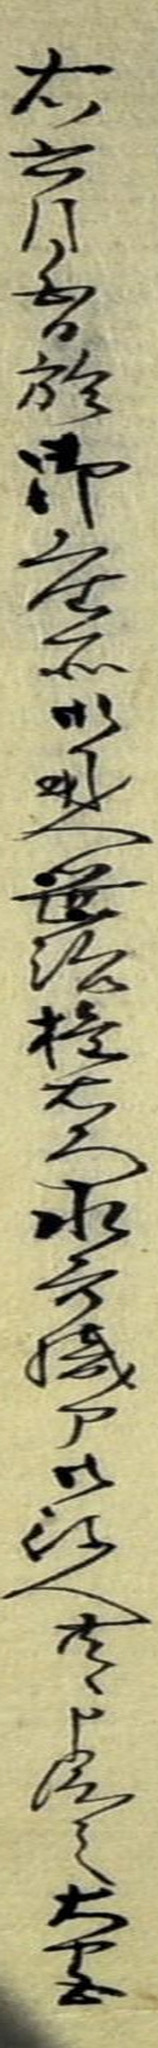右六月五日於御座所御用人笹治権右衛門水谷織部御役人共へ申渡之大宮
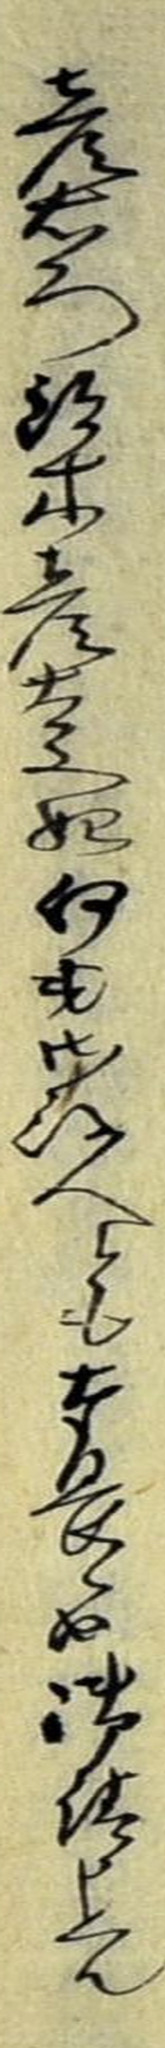彦右衛門鈴木彦大夫始何も御役人とも奉畏候由御請申上ル

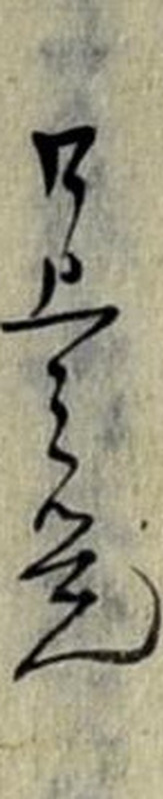口上之覚
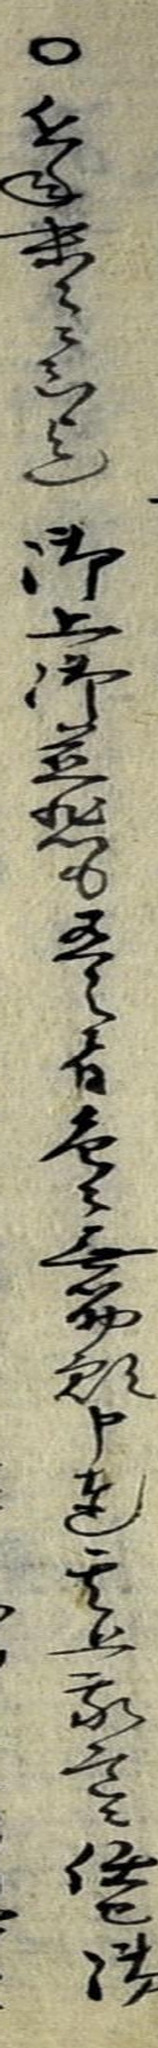〇近年末々ニ至迄御上御慈悲も有之ニ付無筋願申達其上我意ニ任せ御
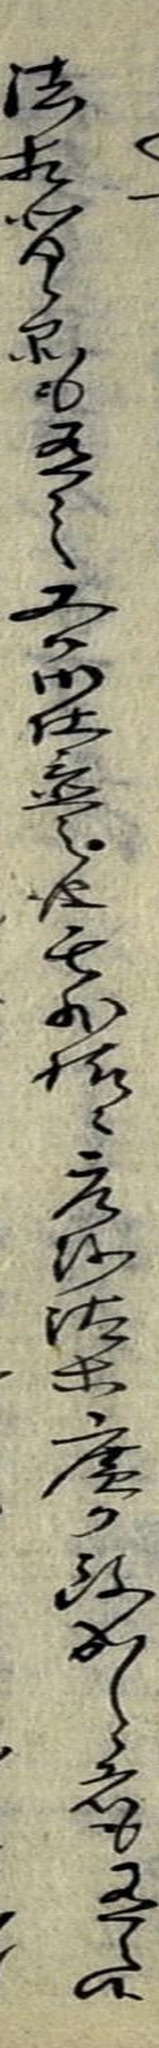法相背候品も有之又ハ御仕置之儀其外様々取沙汰等広ク致成し候者も有之候
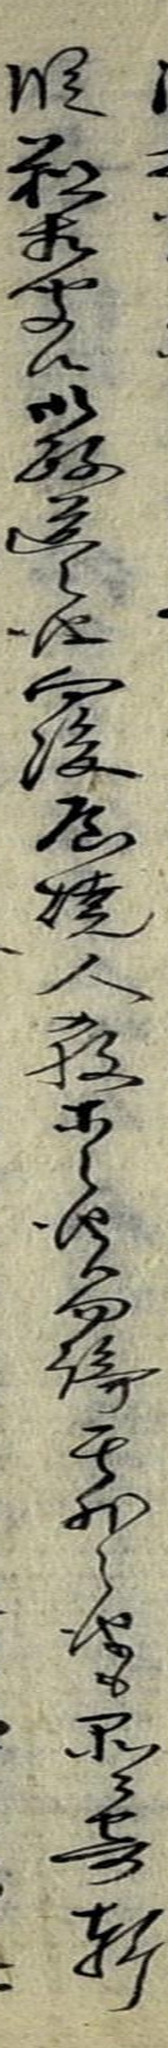段粗相聞候御政道之儀向後屋焼人殺等之儀ハ勿論其外之儀も品ニ寄斬
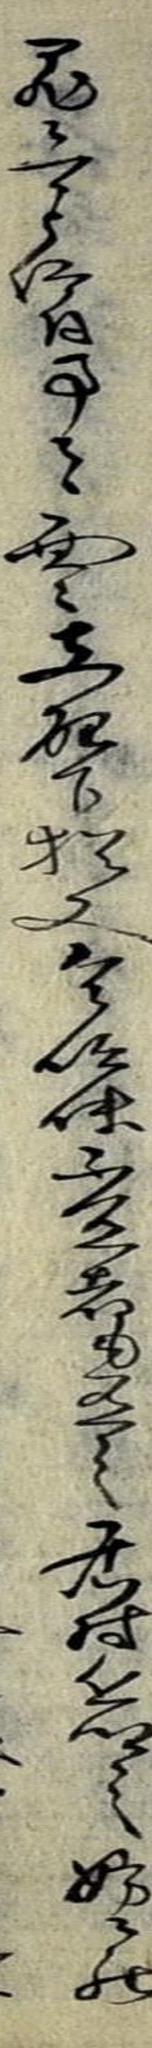罪ニ可被仰付事ニ候面々支配下猶又令吟味不宜者も有之居村近郷之妨ニ罷
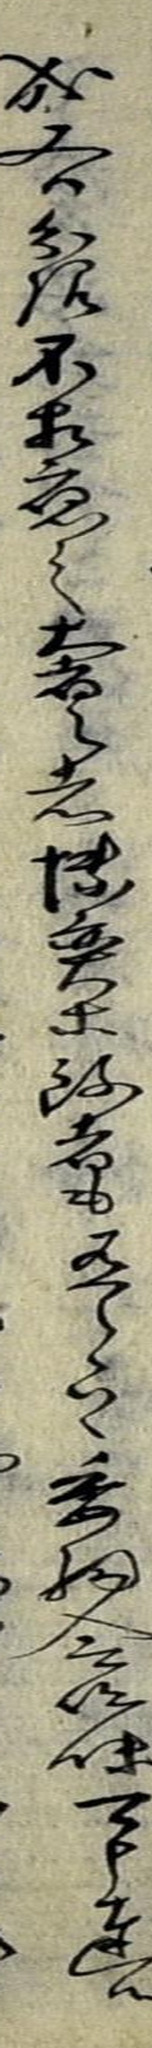成又ハ分限不相応之奢之者博奕等致者も有之候ハヽ委細令吟味可申達候
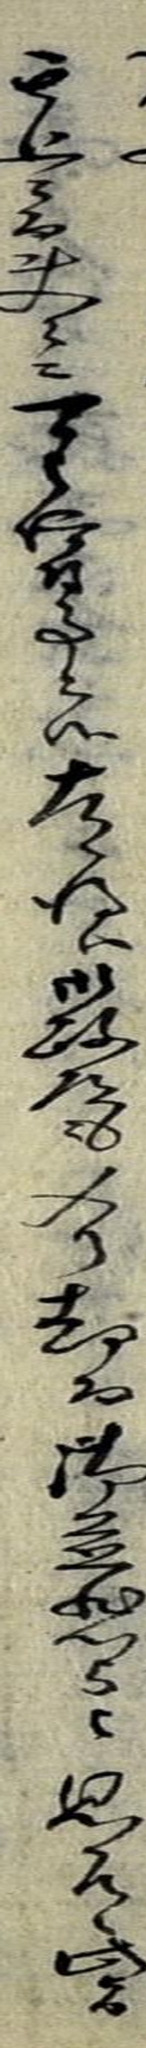其上ニ而夫々ニ可被仰付事ニ候左候得ハ御政道も〆り却而御慈悲与被思召候此旨
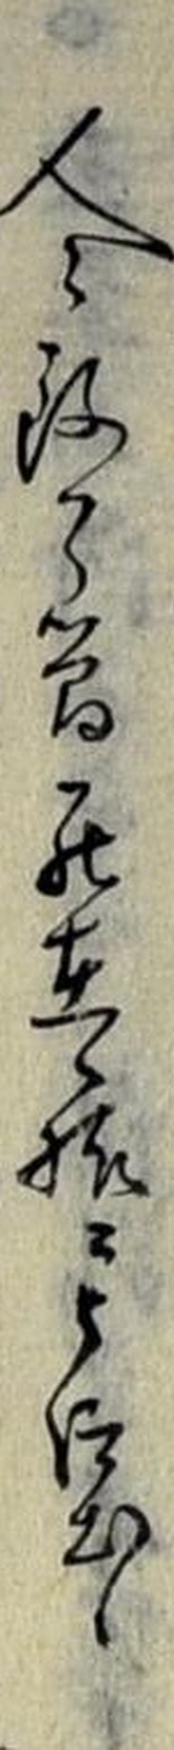人々致了簡罷在候様ニ被仰出候
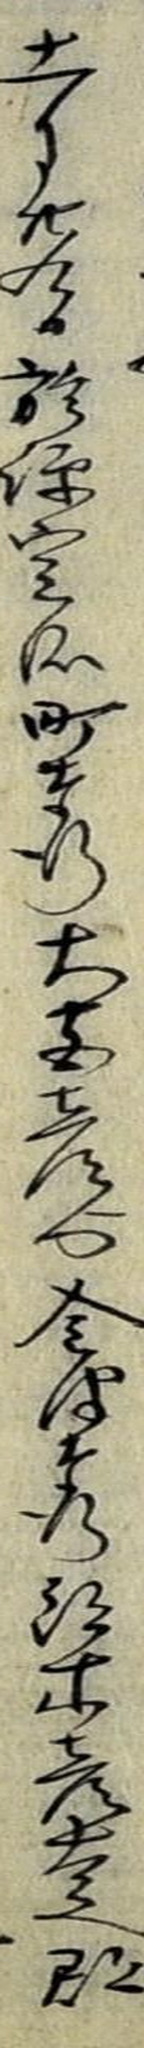十一月廿九日於評定所町奉行大宮彦右衛門金津奉行鈴木彦大夫郡
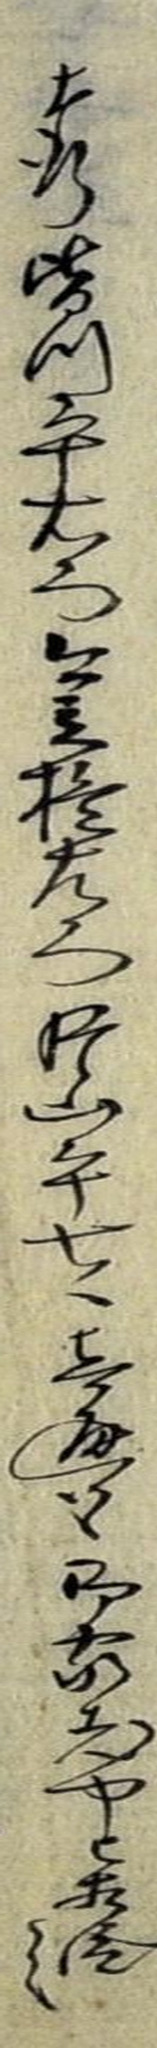奉行皆川平右衛門今立権左衛門片山平七へ壱通ツヽ御家老中被相渡之
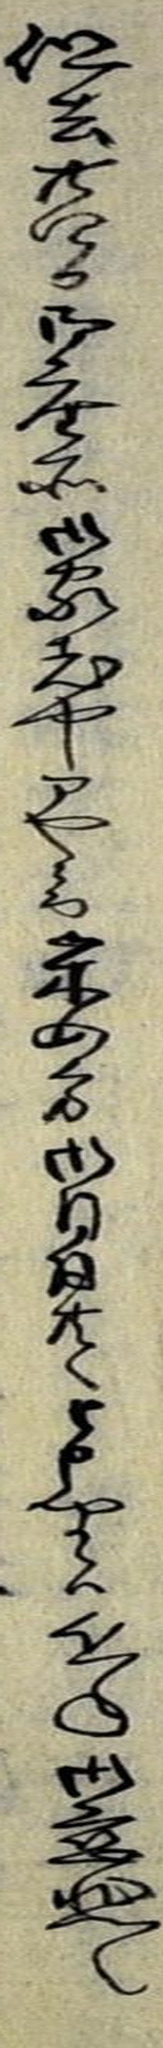但去廿四日御座所御家老中部屋ニ而采女方御目付共へ被申聞候ハ近年御慈悲之
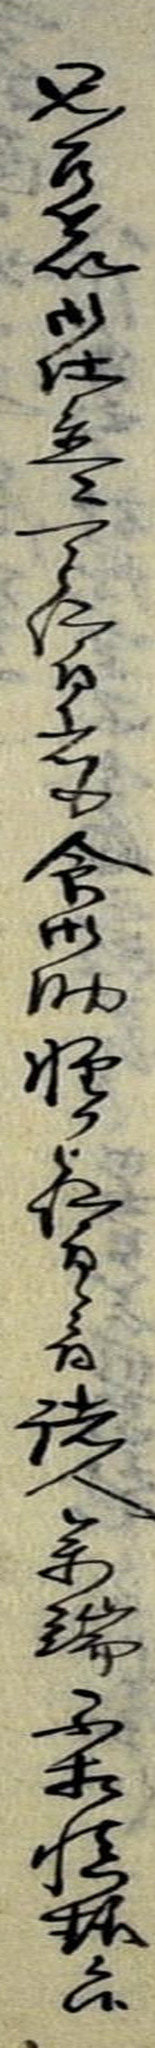思召を以御仕置ニ可被仰付者も命御助軽ク被仰付候ニ付諸人万端不相慎趣ニ候
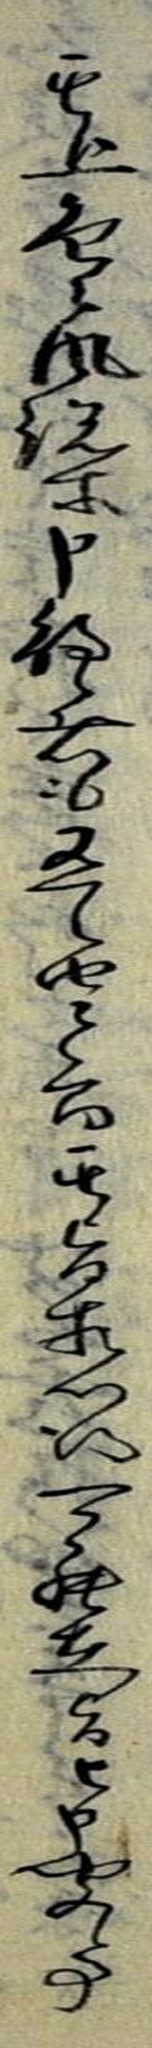其上色々風説等申触候者も有之由ニ候間其旨相心得可罷在旨被申聞候事
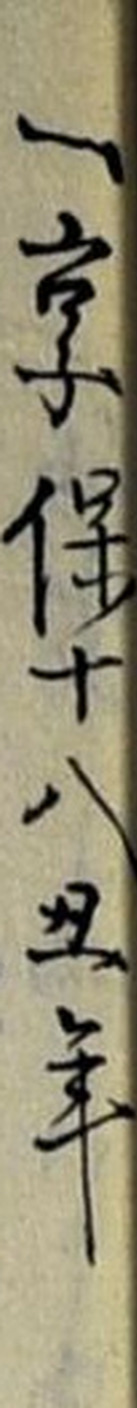一享保十八丑年
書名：命令之部 一
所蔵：福井県文書館 Fukui Prefectural Archives
